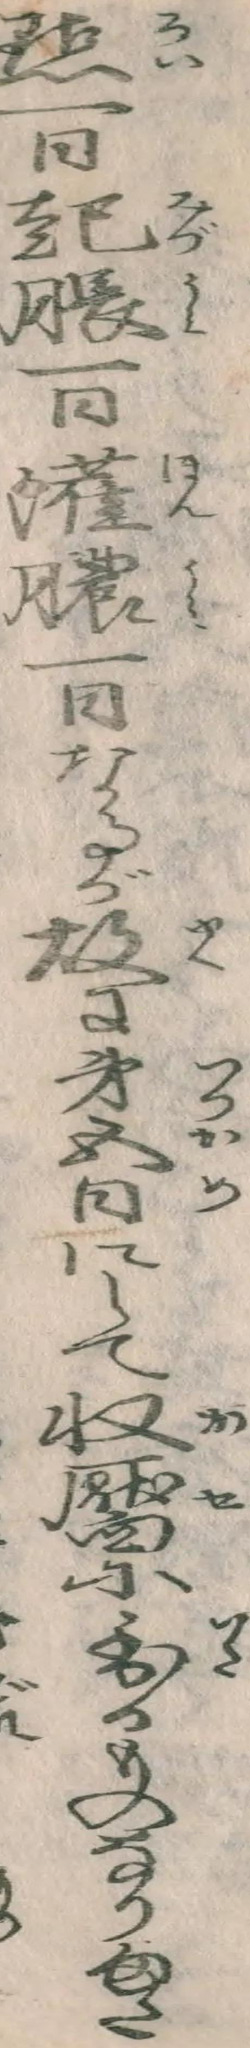熱一日起脹一日濃膿一日なるが故に第五日にして収靨に到るものなりまた
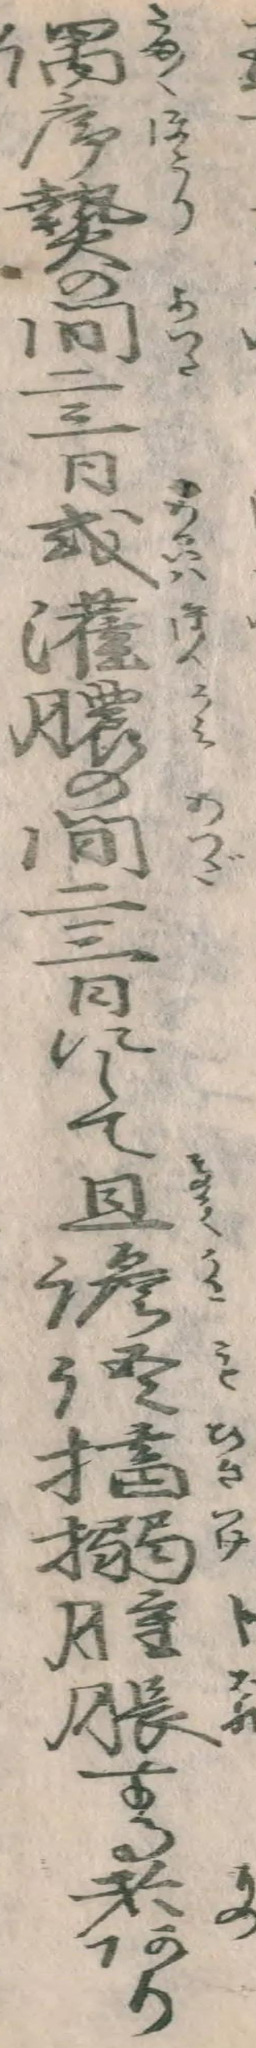偶序熱の間二三日或濃膿の間二三日にして旦譫語搐搦腫脹する者あり
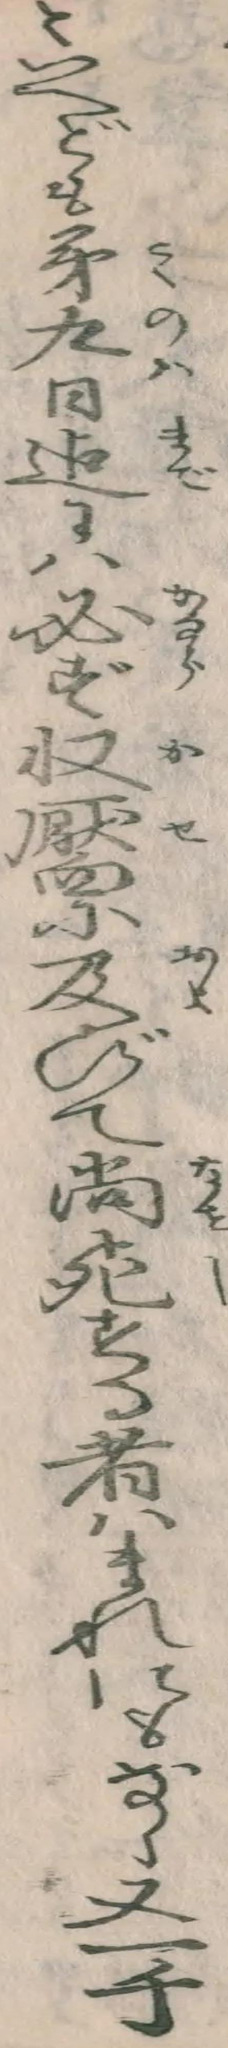といへども第九日迄には必ず収靨に及びて尚死する者はまれにもなる又一千
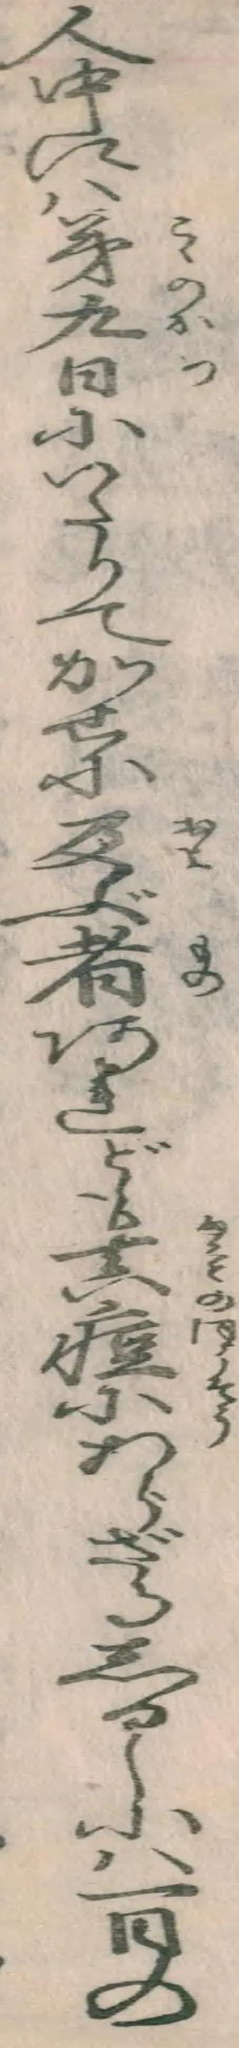人中には第九日にいたりてかせに及ぶ者あれども真痘あらざるしるしには一日の
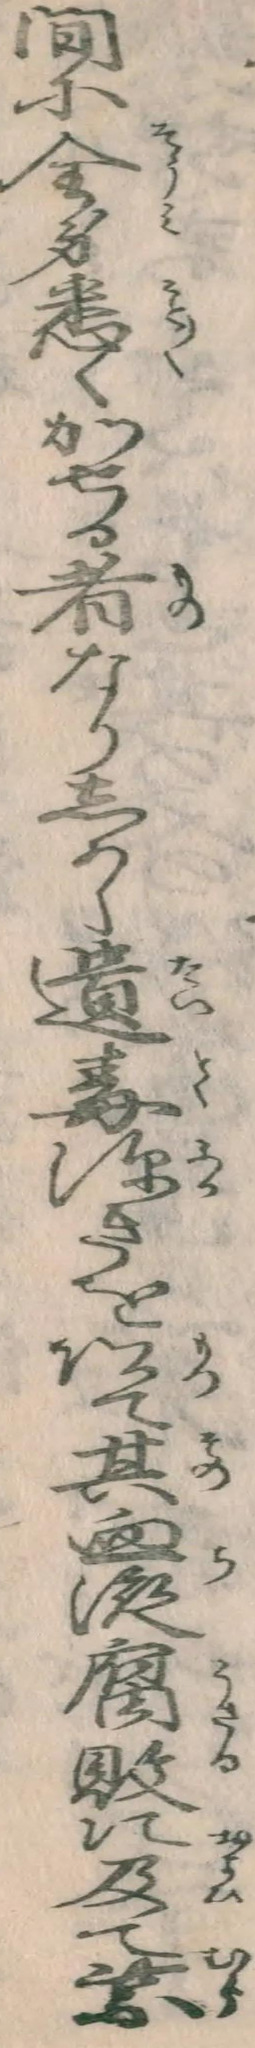間に全身悉くかせる者なりしかし遺毒深きを以て其血液腐敗に及て柴
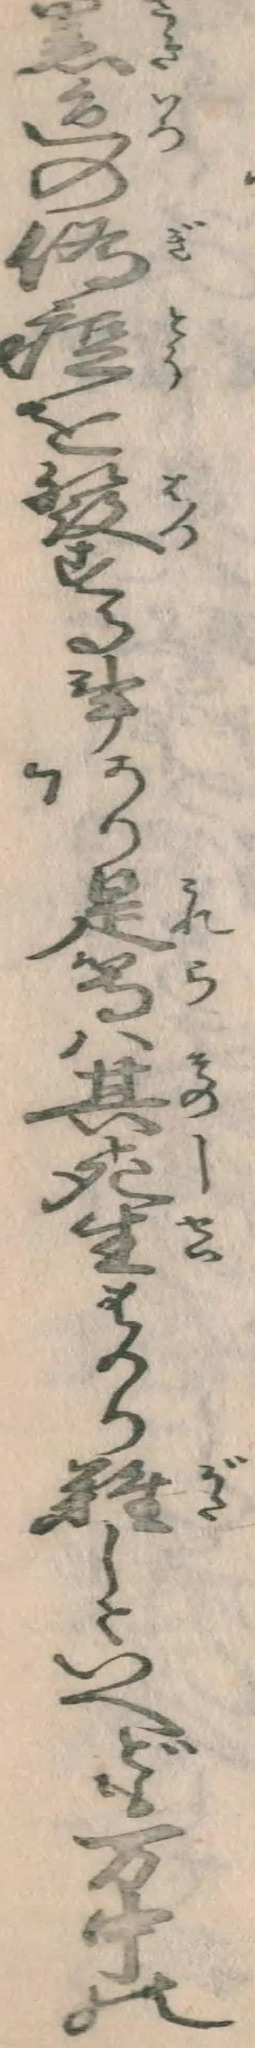黒色の偽痘を発する事あり是等は其死生はかり難しといへども万中の
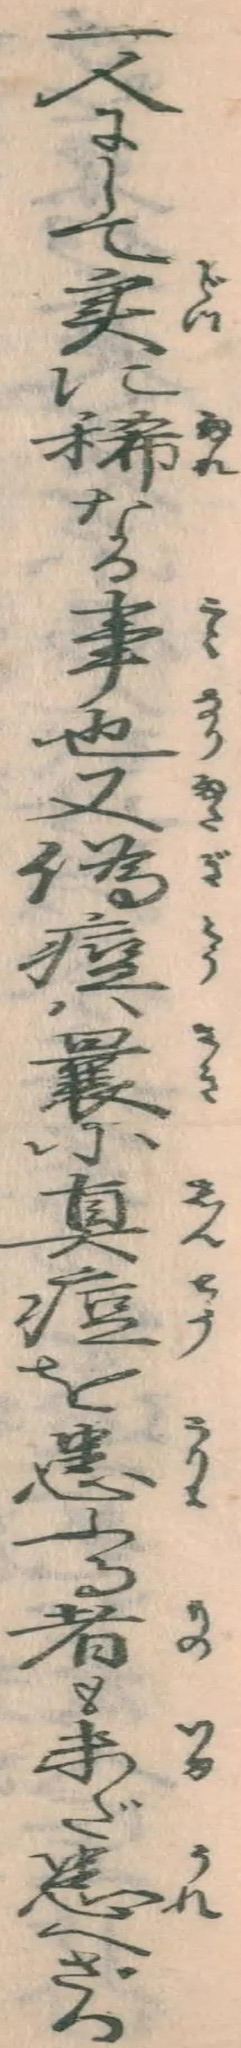一人にして実に稀なる事也又偽痘はに真痘を患ふる者も未だ患へざる
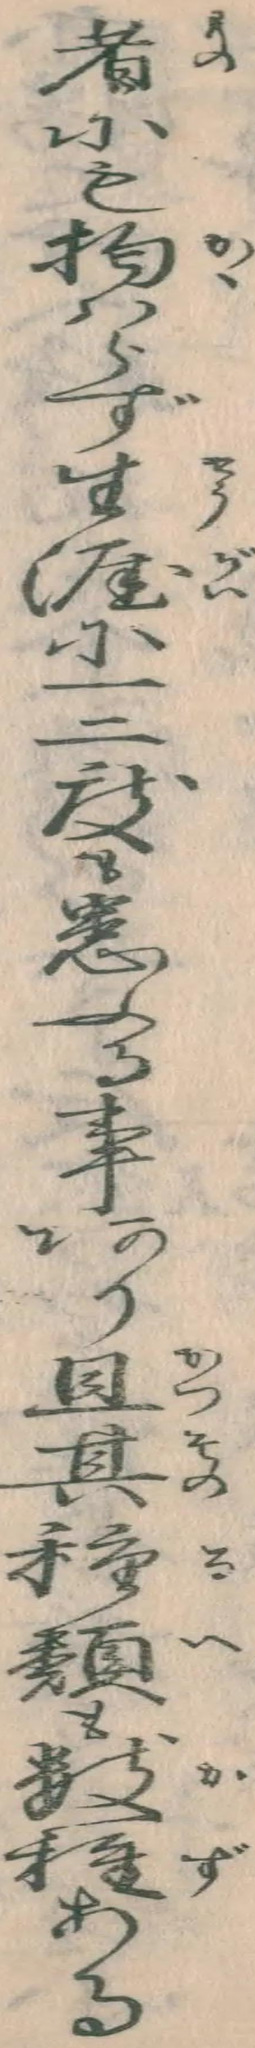者にも拘はらず生涯に一二度も患ふる事あり且其種類も数種ある
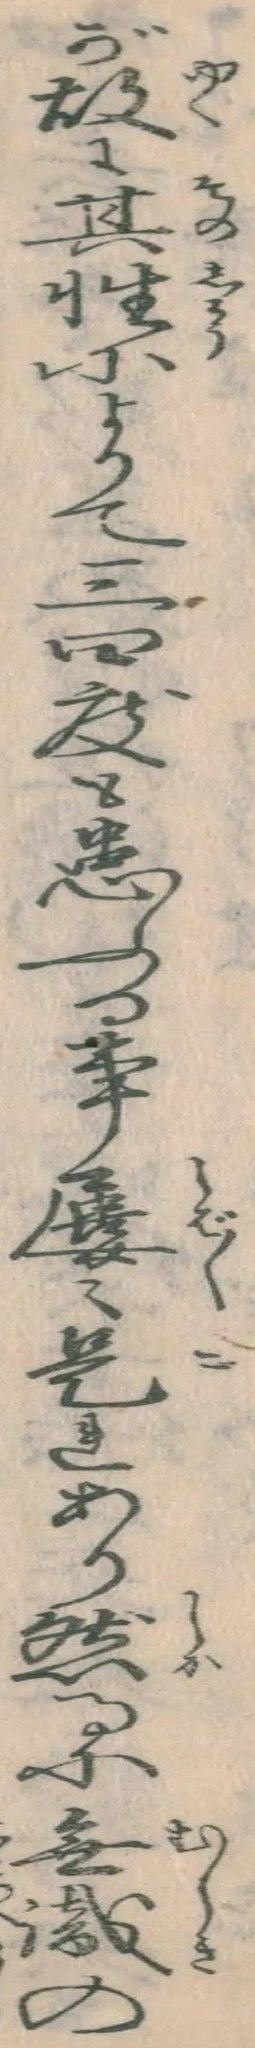が故に其性によりて三四度も患ふる事屡々是れあり然るに無識の
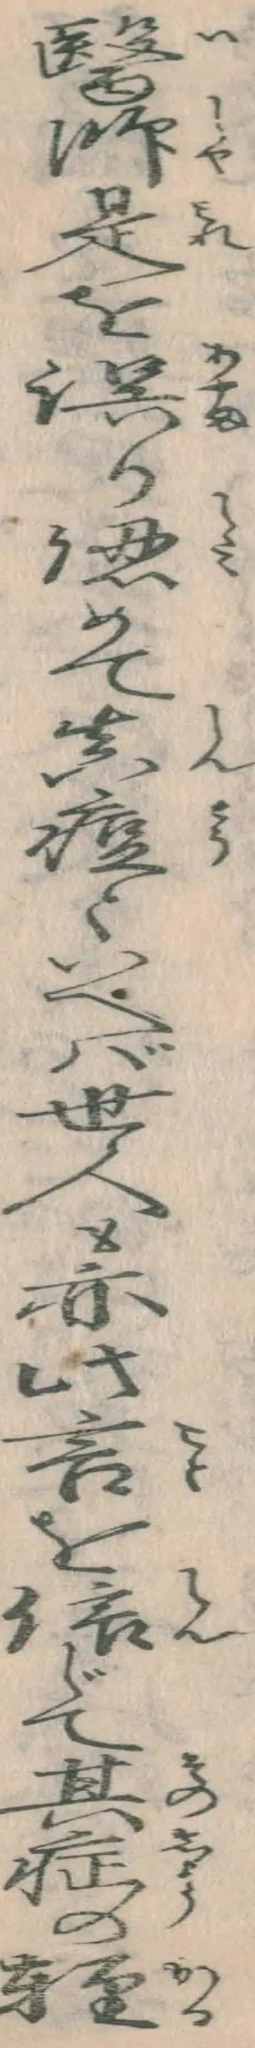医師是を誤り認めて真痘といへば世人も亦此言を信じて其症の軽
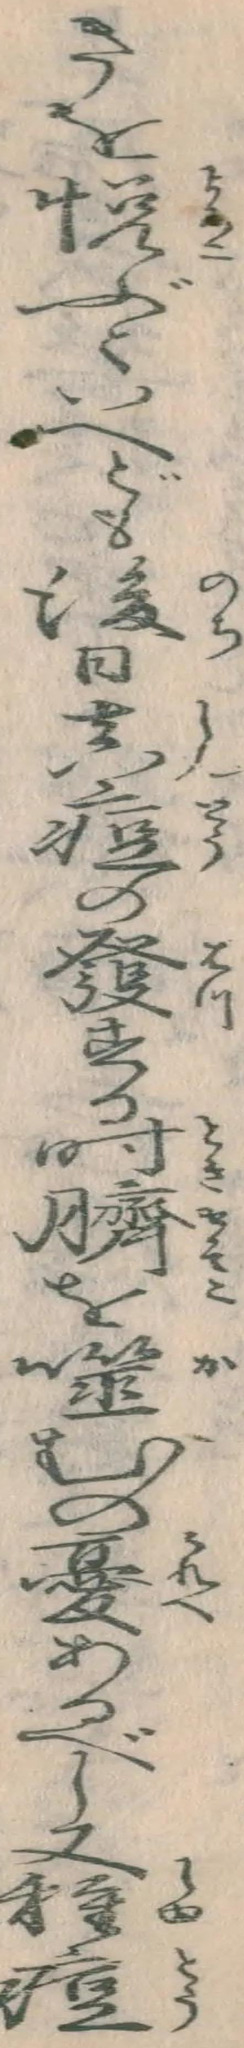きを悦ぶといへども後日真痘の発する時臍を喧むの憂あるべし又種痘
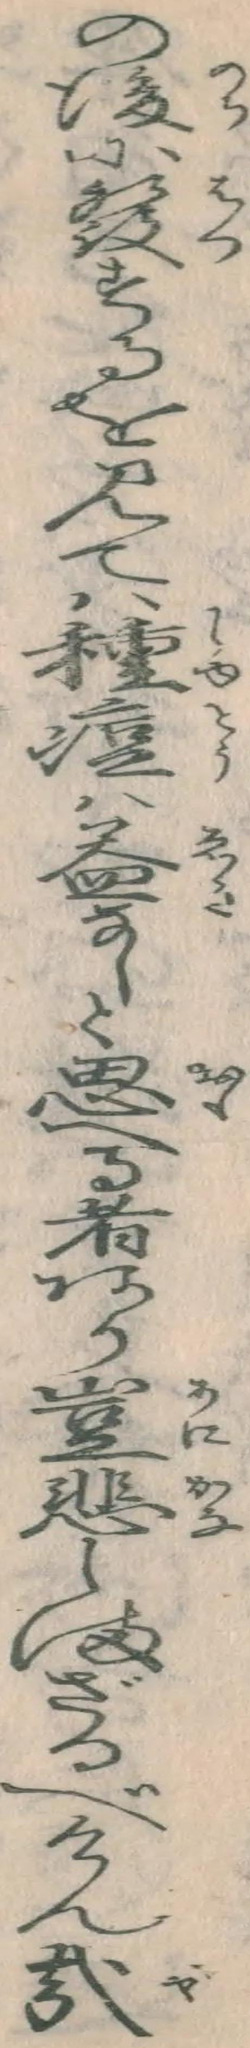の後に発するを見ては種痘は益なしと思へる者あり豈悲しまざるべけん哉
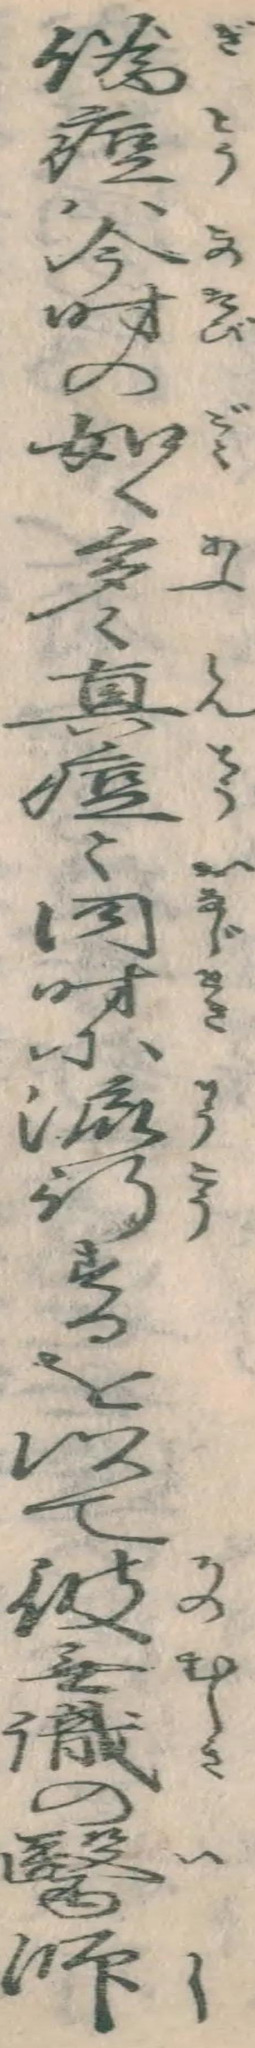偽痘は今時の如く多く真痘と同時に流行するを以て彼無識の医師
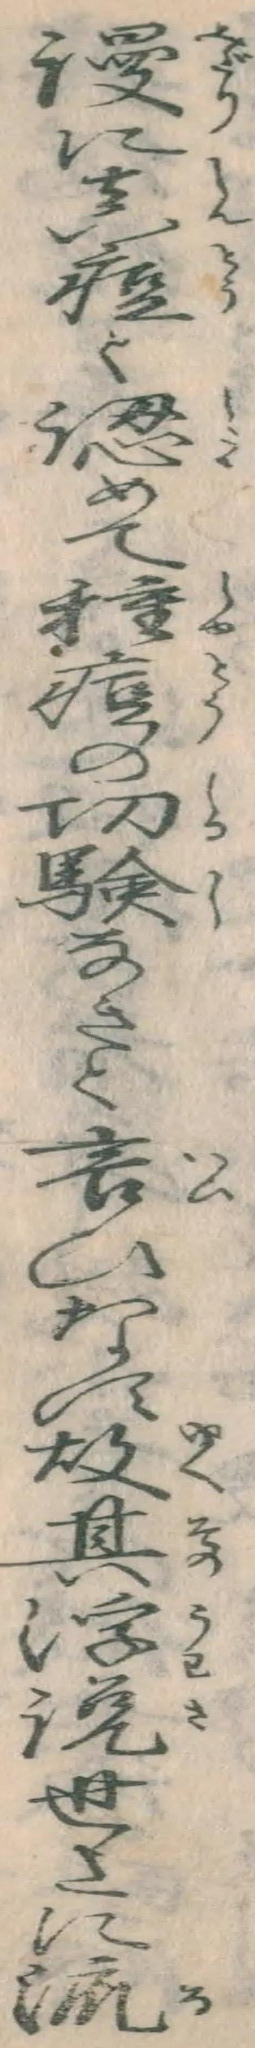漫に真痘と認めて種痘の切験なきと言ひなに故其浮説世上に流
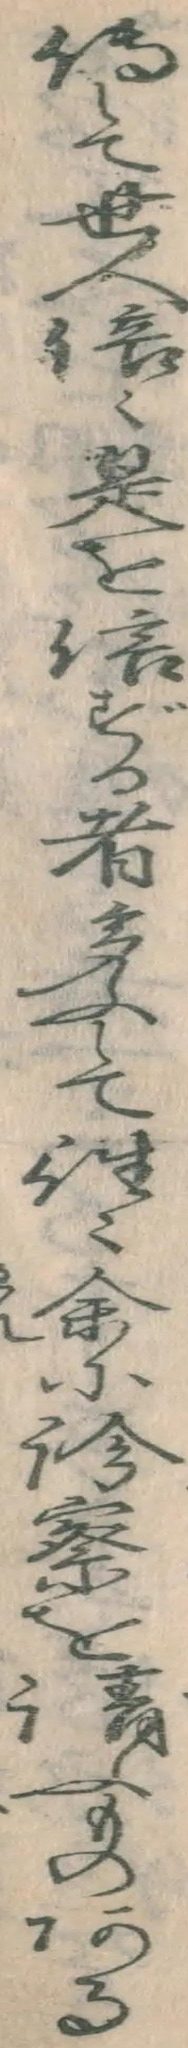伝して世人倍く是を信ずる者多ふして往々余に診察を請ふものある

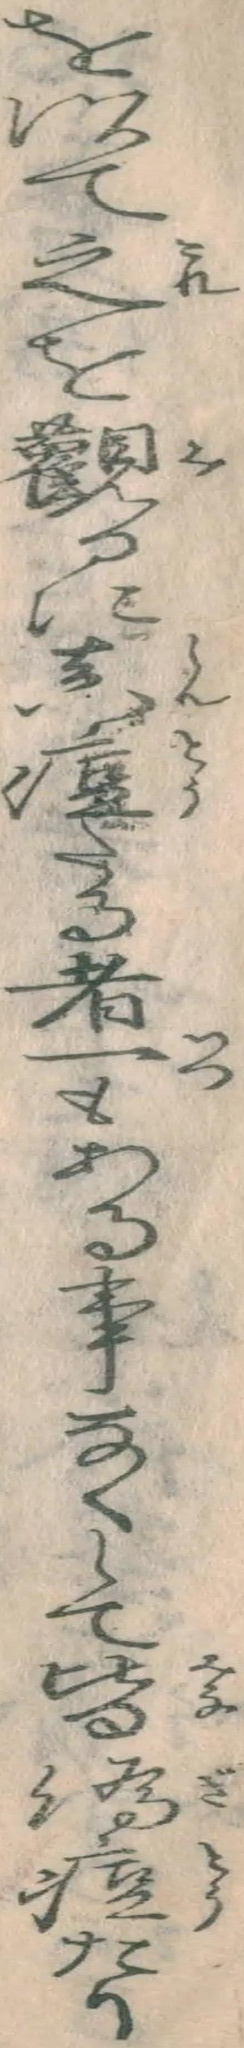を以て之を観るに真痘たる者一もある事なくして皆偽痘たり
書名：種痘辨
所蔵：国立国会図書館 National Diet Library, JAPAN
